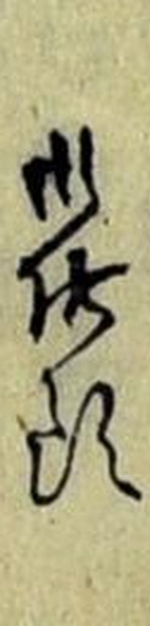御供頭
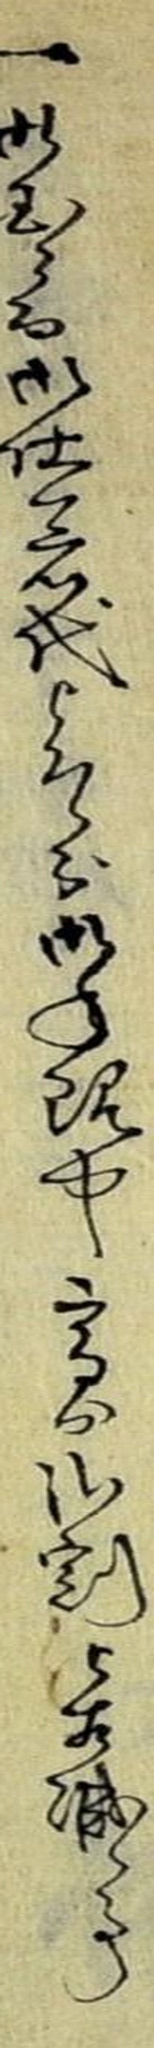一御国ニ而御仕着代申下候分御年限中高ゟ弐割被相減候事
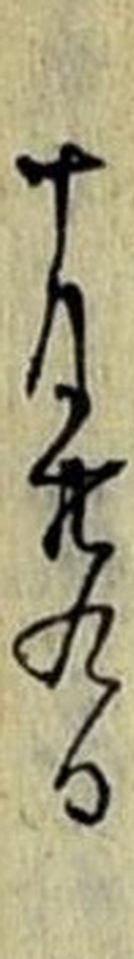十月廿九日
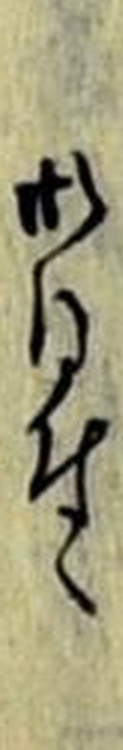御目付へ
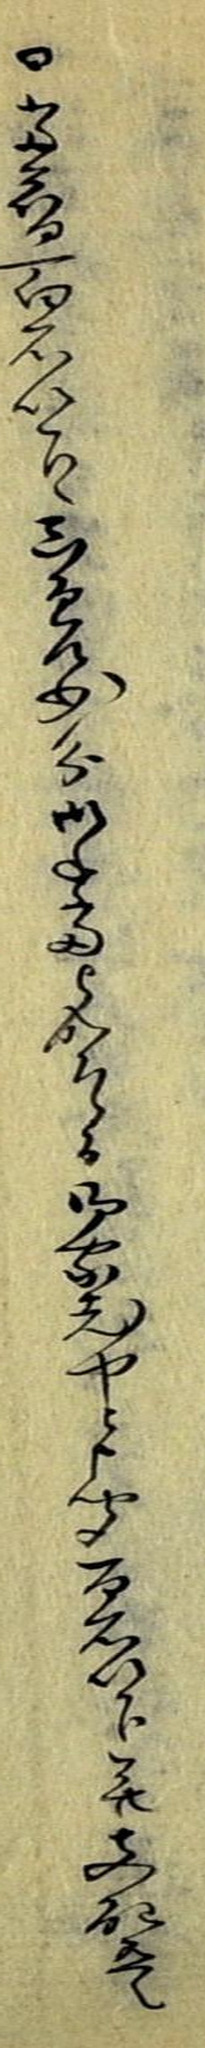〇当暮百石以下へ至而乍少分御手当被成下候ニ付御家老中被申聞百石以下并支配有之
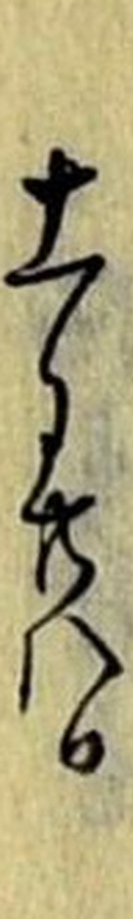十一月廿八日
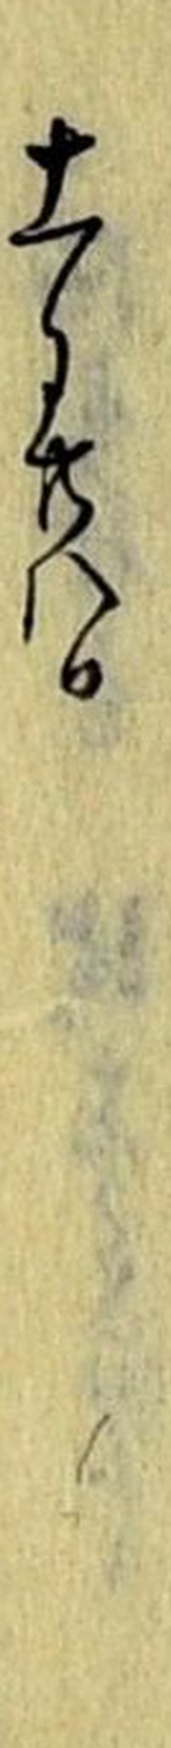十一月廿八日
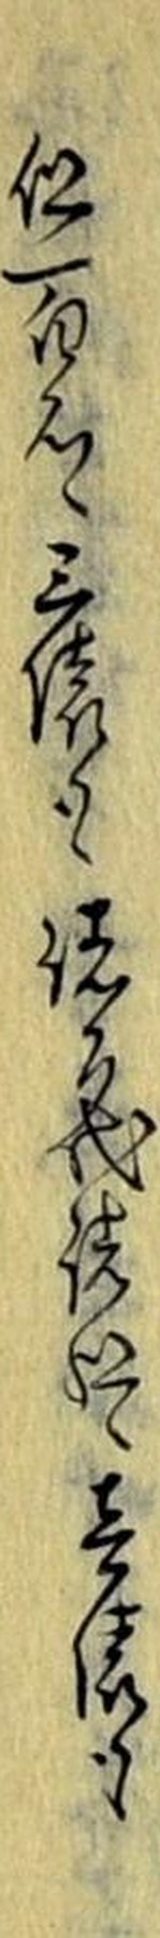但百石へ三俵ツヽ諸下代諸組へ壱俵ツヽ

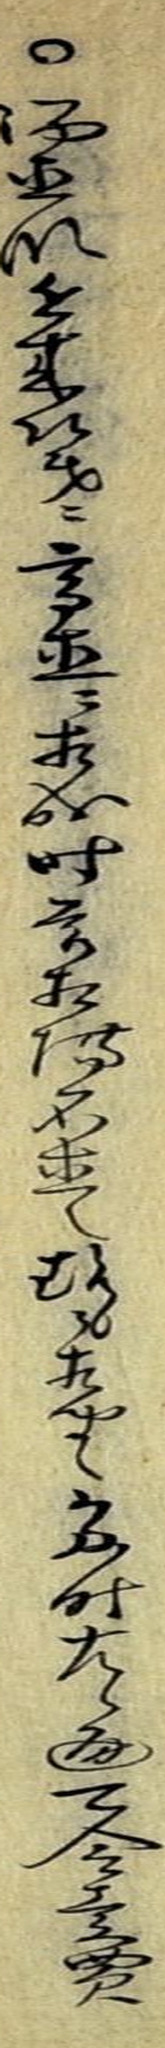〇酒直段近来次第ニ高直ニ相成時節相場不直之趣も相聞候当時左之通可令売買
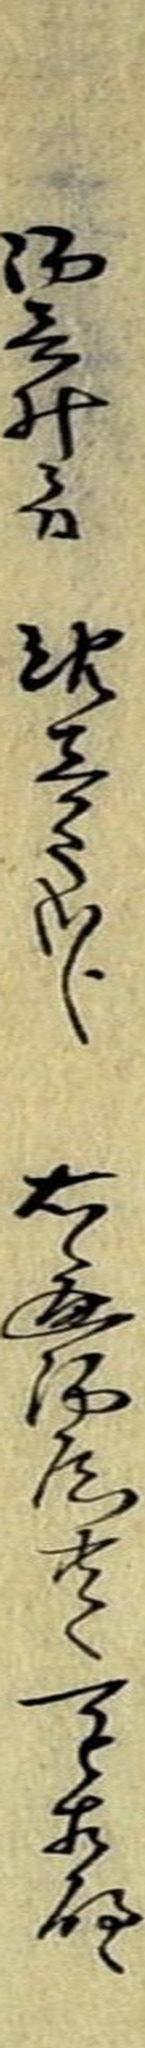事酒壱升ニ付銀壱匁弐分右之通酒屋共へ可被相触候
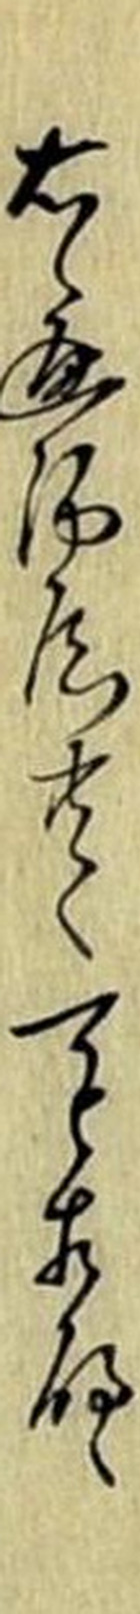右之通酒屋共へ可被相触候
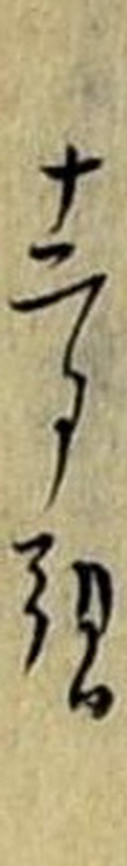十二月朔日
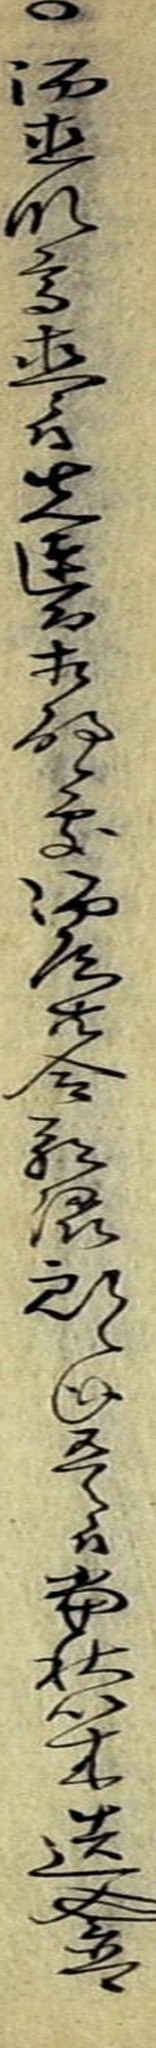〇酒直段高直ニ付先達而相触候処酒屋共令難渋願之趣有之ニ付当秋以来造込置候
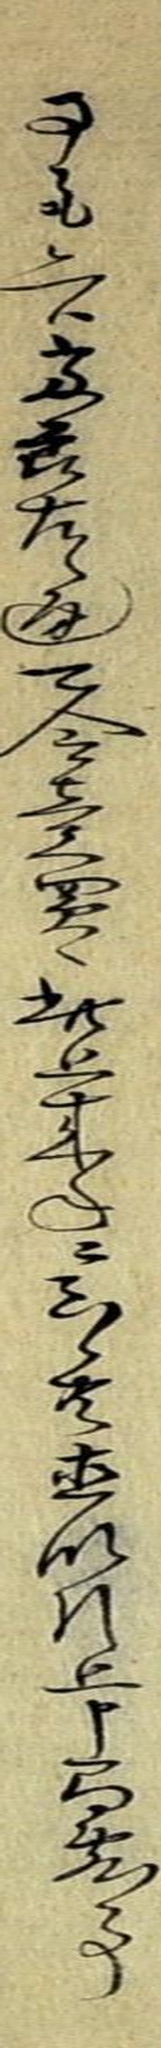事ニも候へハ当節左之通可令売買候此上来年ニ至候共直段引上申間敷事
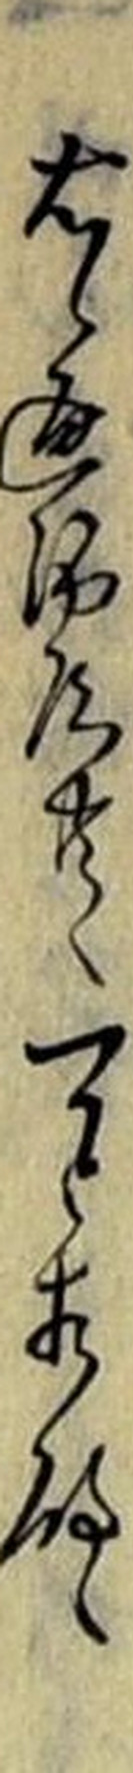右之通酒屋共へ可被相触候
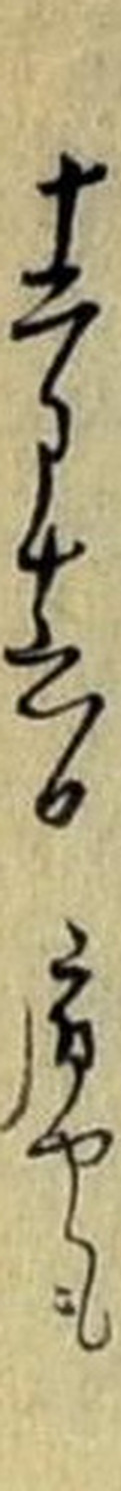十二月十六日府中へも
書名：命令之部 五
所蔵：福井県文書館 Fukui Prefectural Archives
